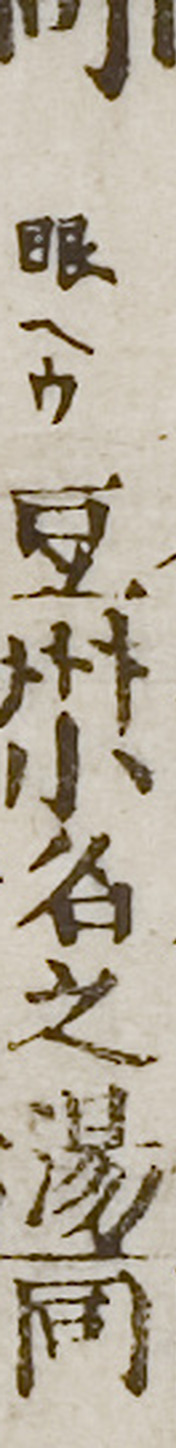同眼ヘウ豆州小名之湯
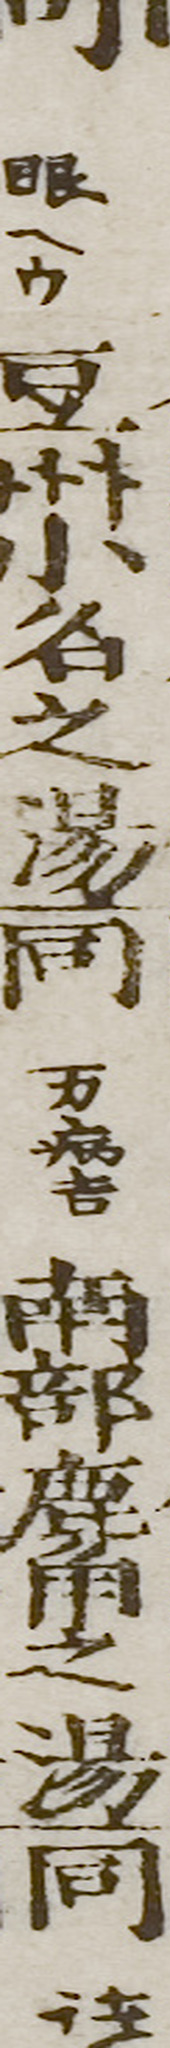同眼ヘウ豆州小名之湯
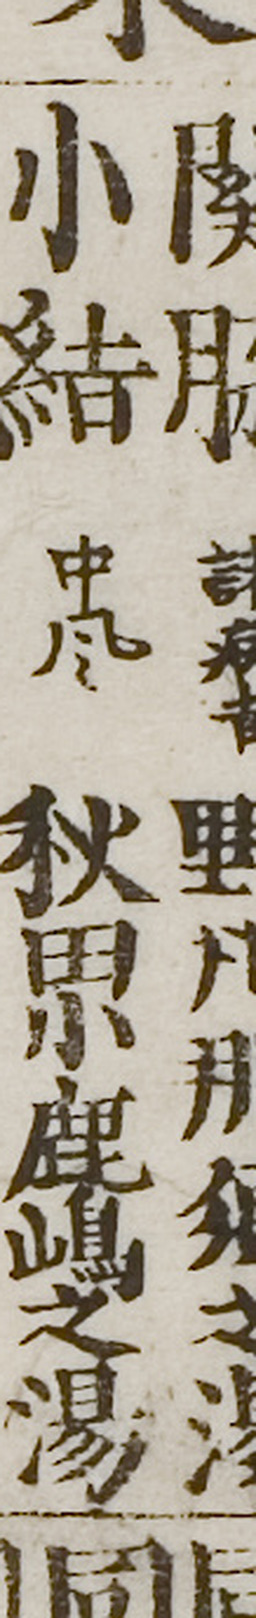小結中風秋田小鹿嶋之湯
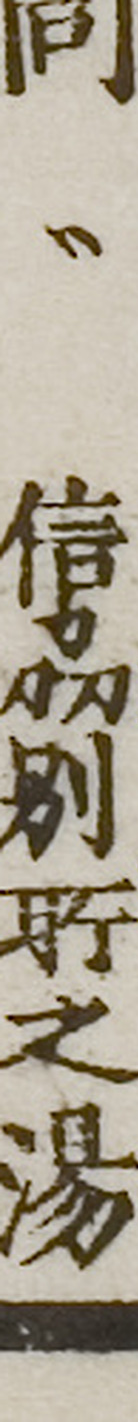同〃信州別所之湯
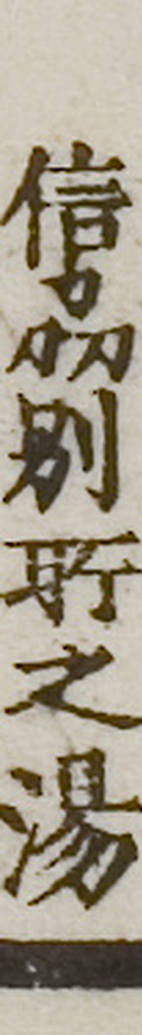同〃信州別所之湯
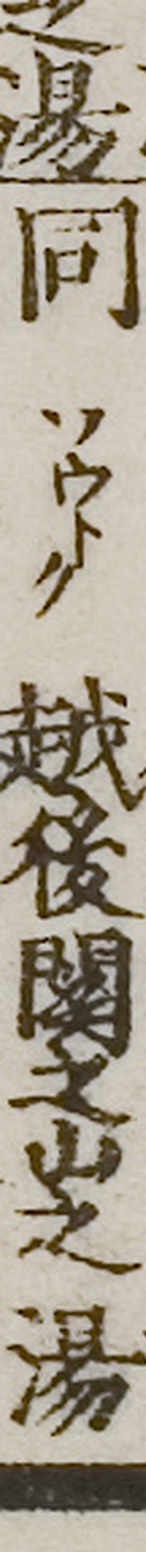同ソウトク越後関之山之湯
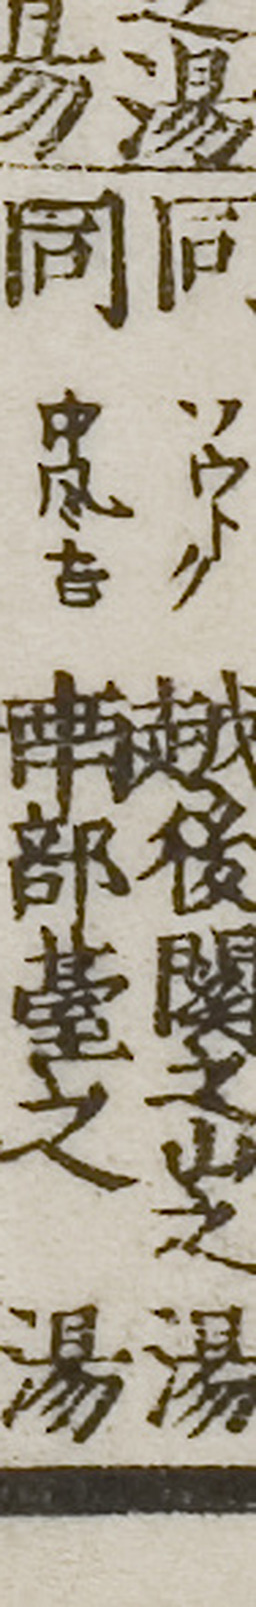同中風吉南部台之湯
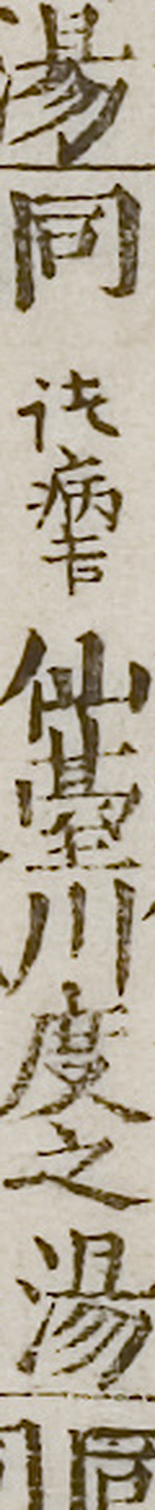同諸病吉仙台川度之湯
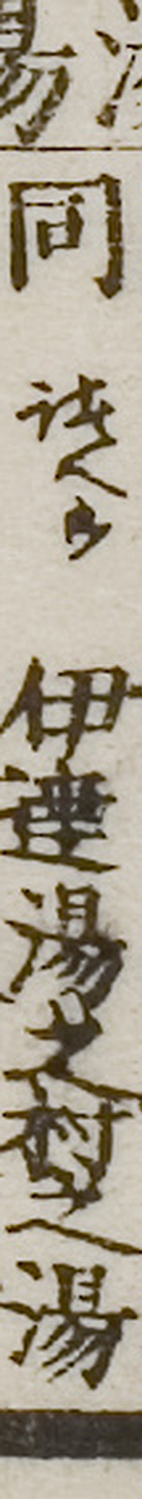同諸ヘウ伊達湯之村之湯
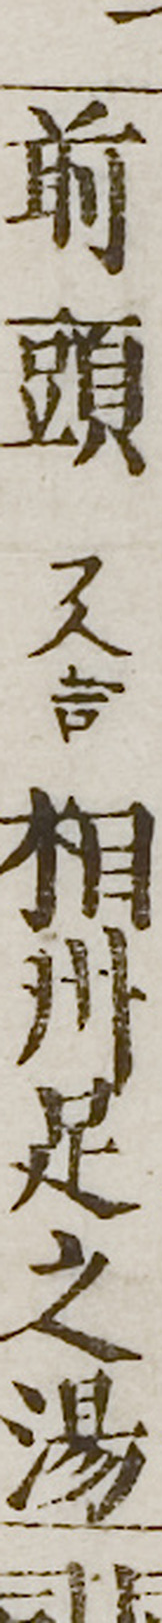前頭フ人吉相州足之湯
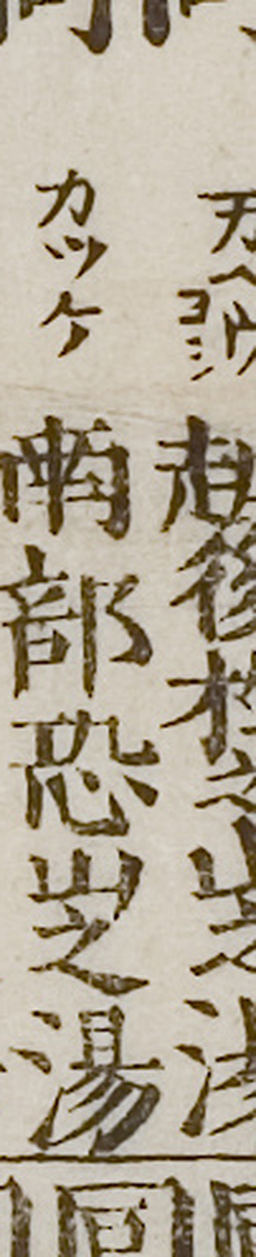同カツケ南部恐山之湯
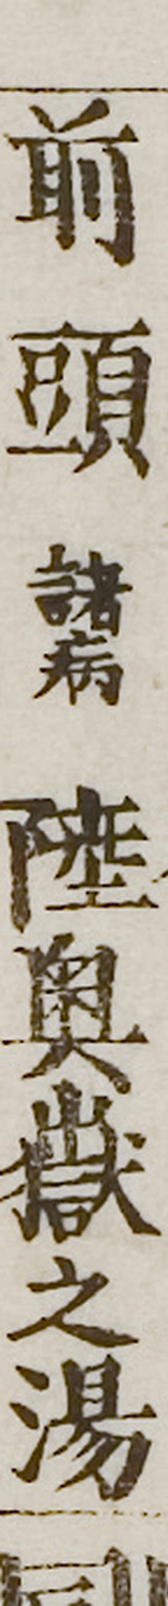前頭諸病陸奥嶽之湯
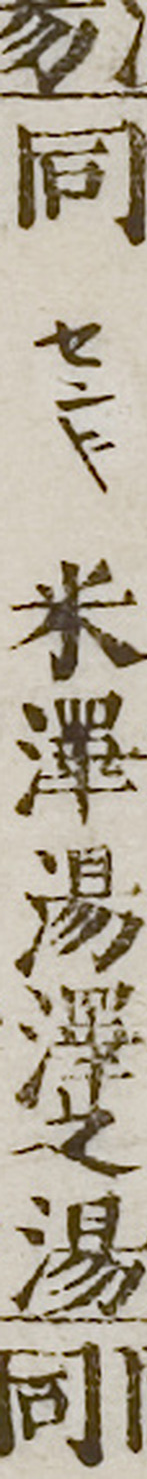同センキ米沢湯沢之湯
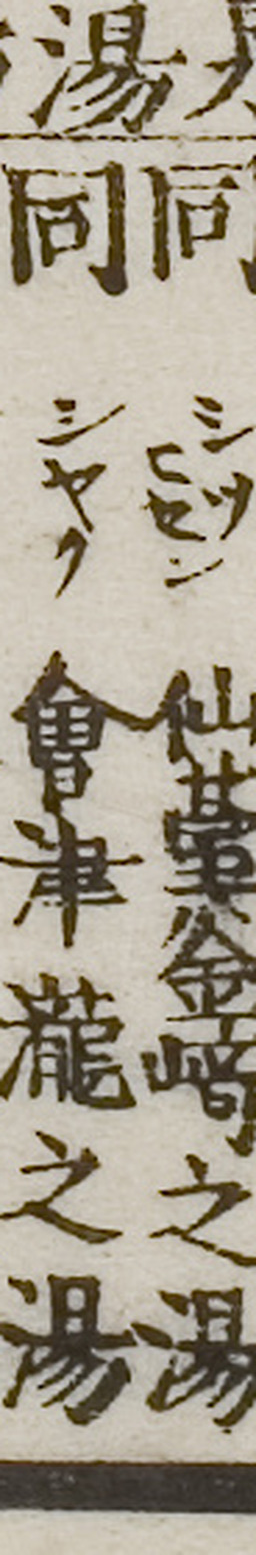同シヤク会津滝之湯
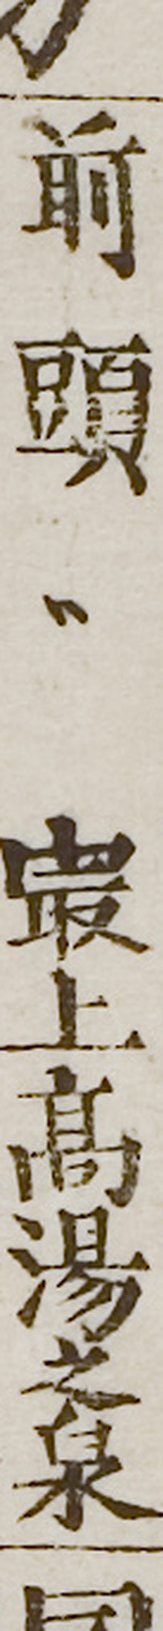前頭〃最上高湯之泉
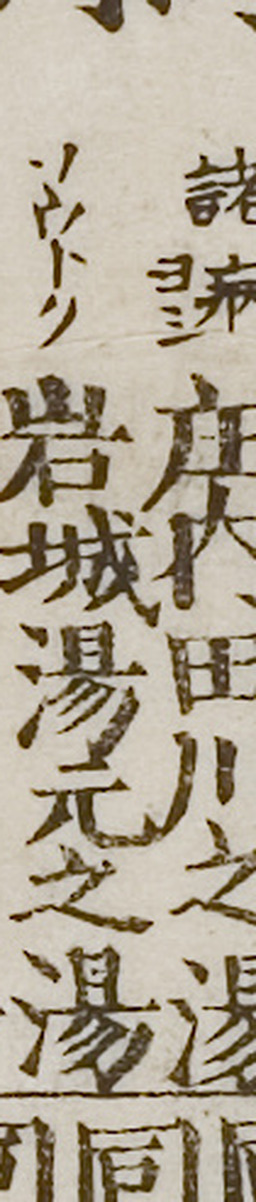同ソウトク岩城湯元之湯
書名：諸国温泉一覧
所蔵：東京大学総合図書館 General Library in the University of Tokyo, JAPAN
